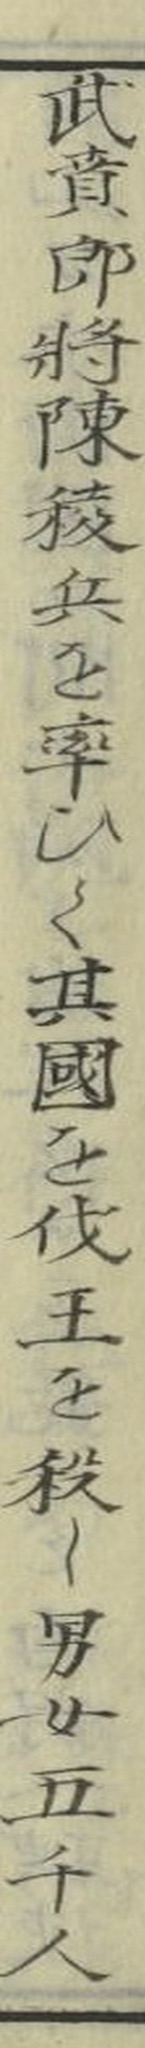武賁郎将陳稜兵を率ひて其国を伐王を殺し男女五千人
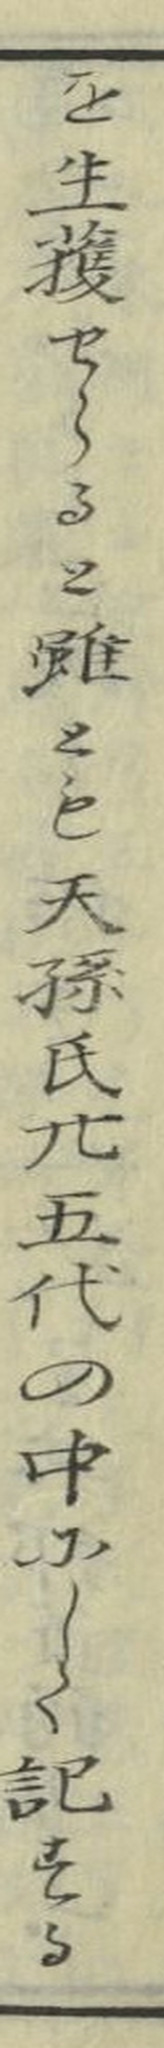を生獲せらると雖とも天孫氏廾五代の中にして記する
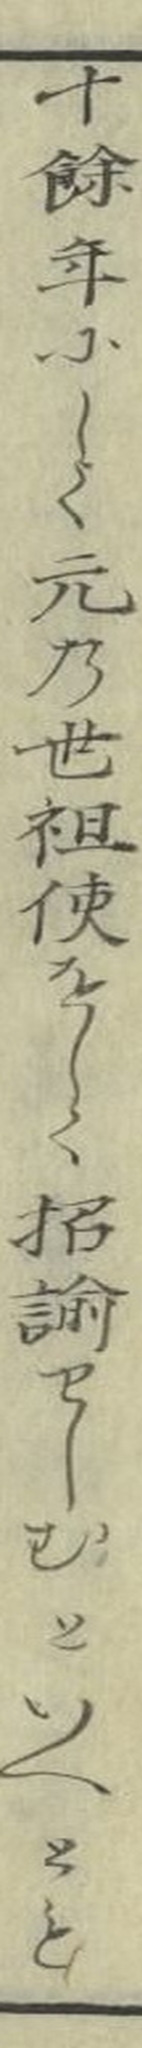十餘年にして元の世祖使をして招諭せしむといへとも
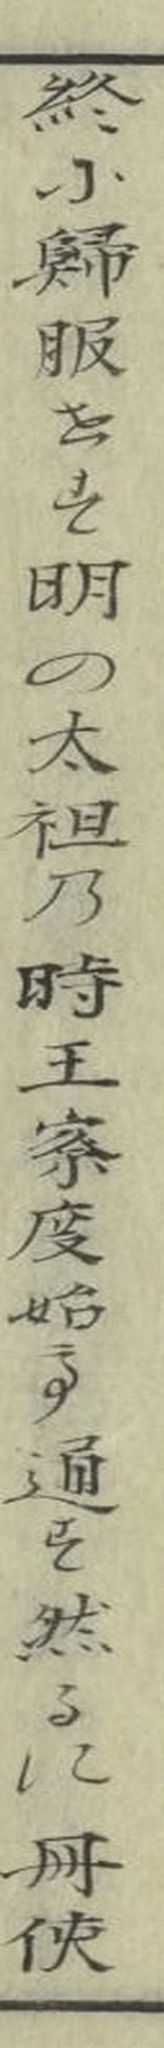終に帰服せす明の太祖の時王寮度始て通す然るに冊使
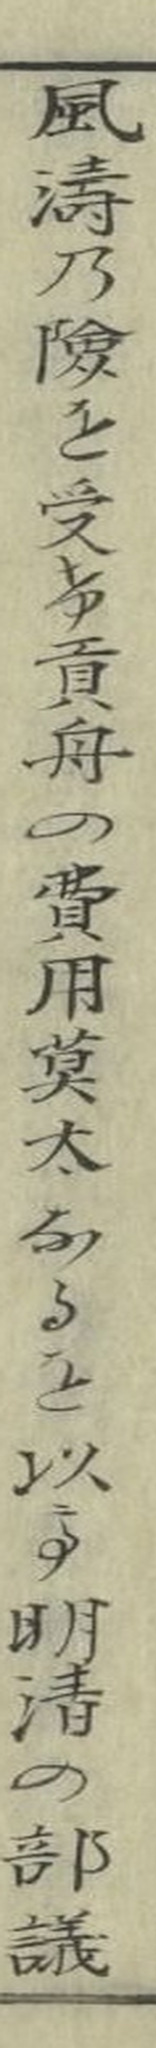風涛の険を受け貢舟の費用莫太なるを以て明清の部議
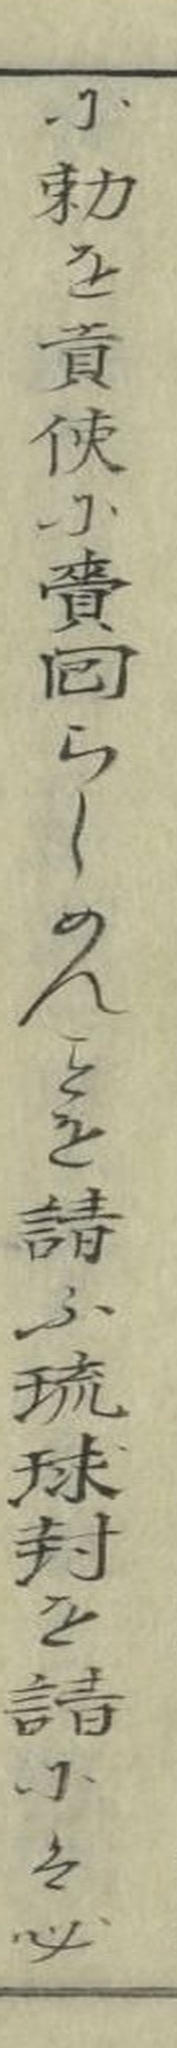に勅を貢使に賚回らしめんことを請ふ琉球封を請には必
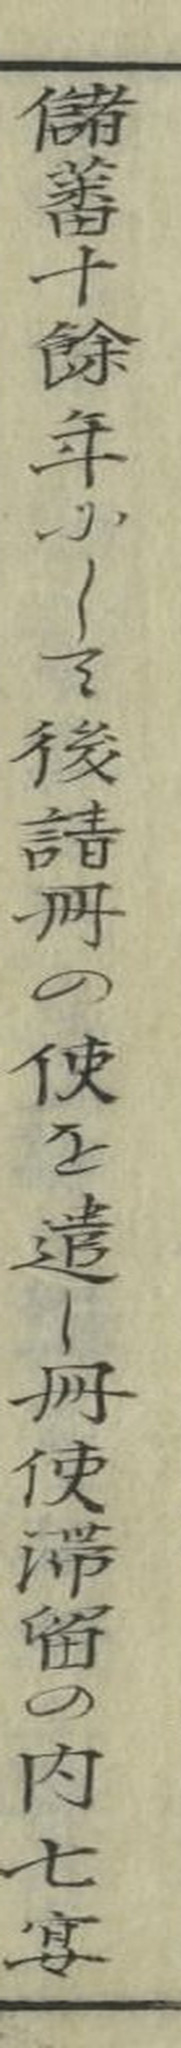儲蕃十餘年にして後請冊の使を遣し冊使滞留の内七宴

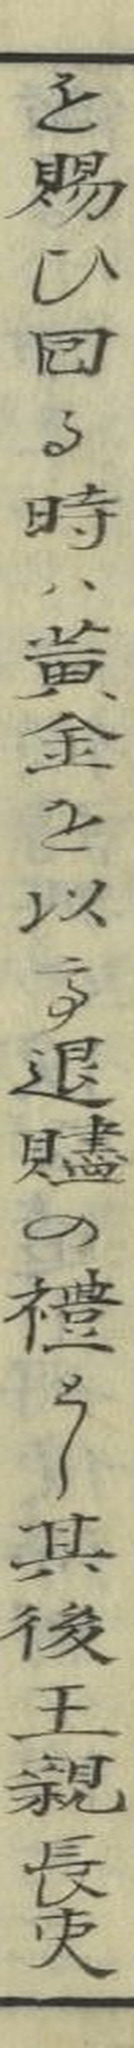を賜ひ回る時は黄金を以て退贐の礼とし其後王親長吏
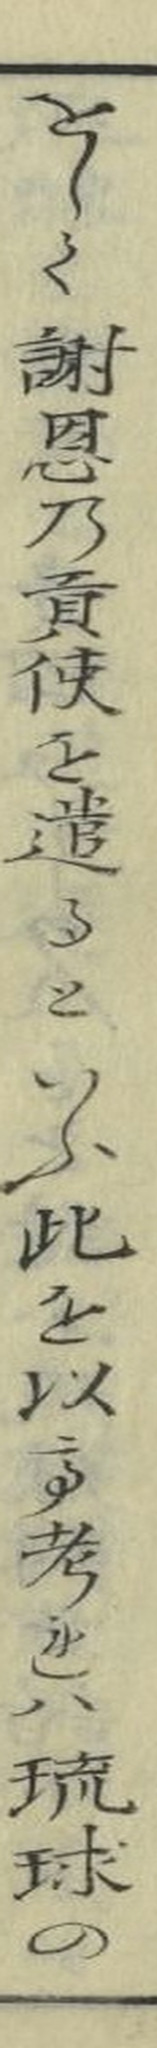をして謝恩の貢使を遣るといふ此を以て考れは琉球の
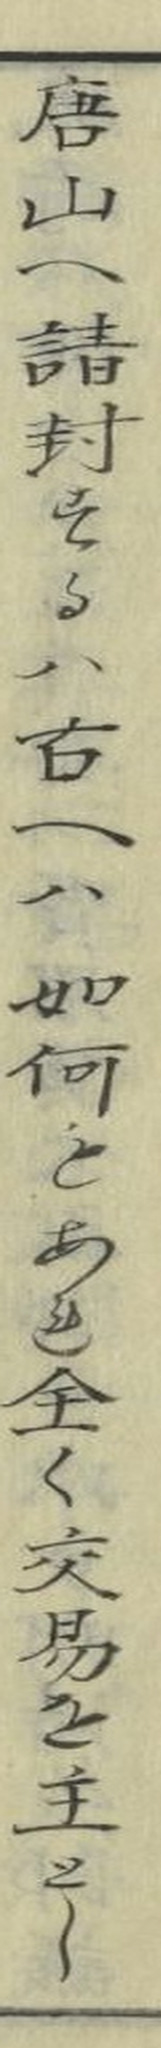唐山へ請封するは古へは如何もあれ全く交易を主とし
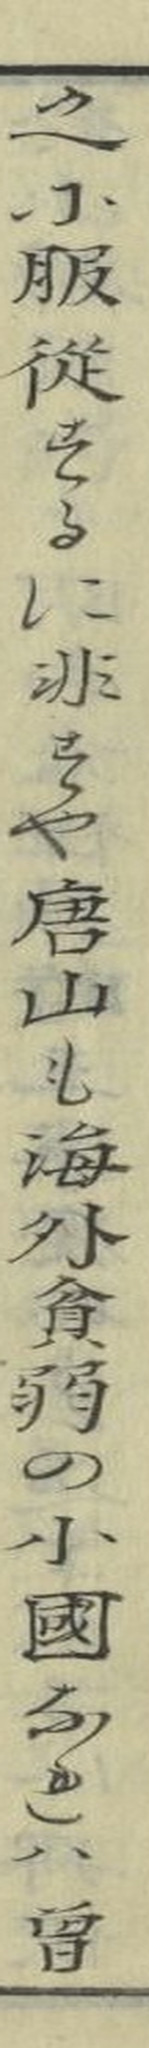之に服従するに非すや唐山も海外貧弱の小国なれは曽
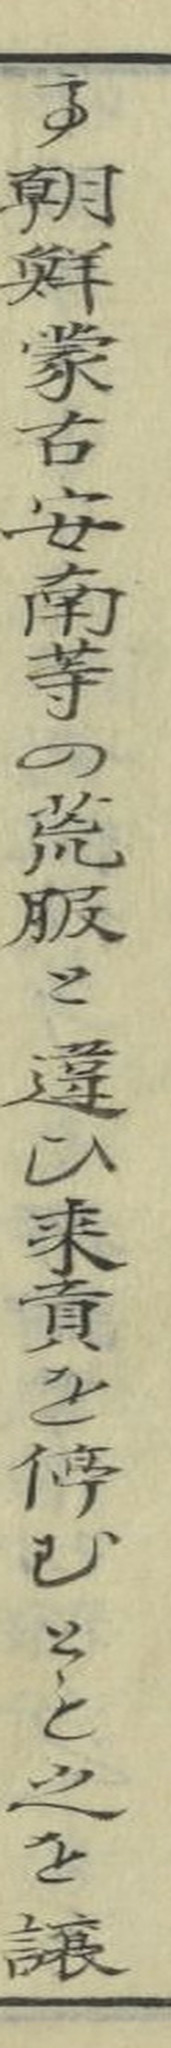て朝鮮蒙古安南等の荒服と違ひ来貢を停むとも之を譲
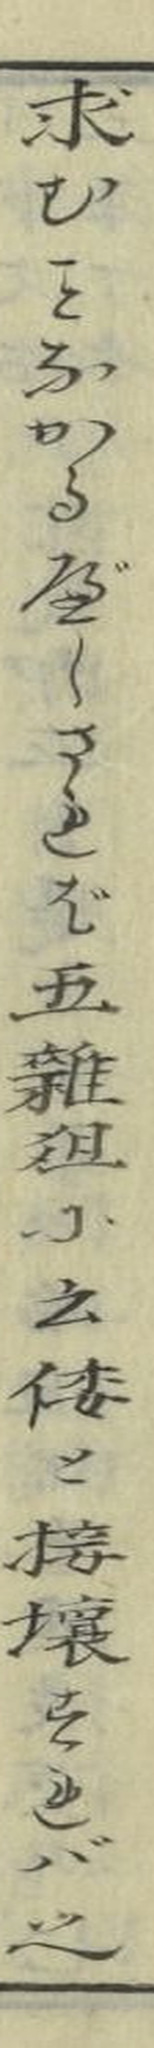求むことなかるべしされば五雑俎に云倭と接壌すれば之
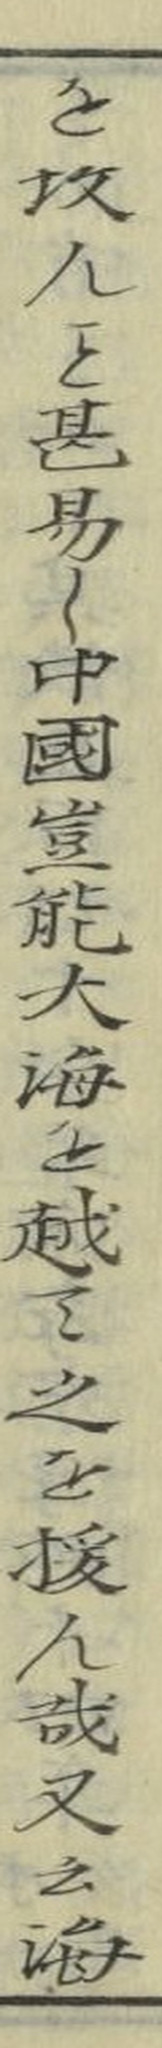を攻んこと甚易し中国豈能大海を越て之を援ん哉又云海
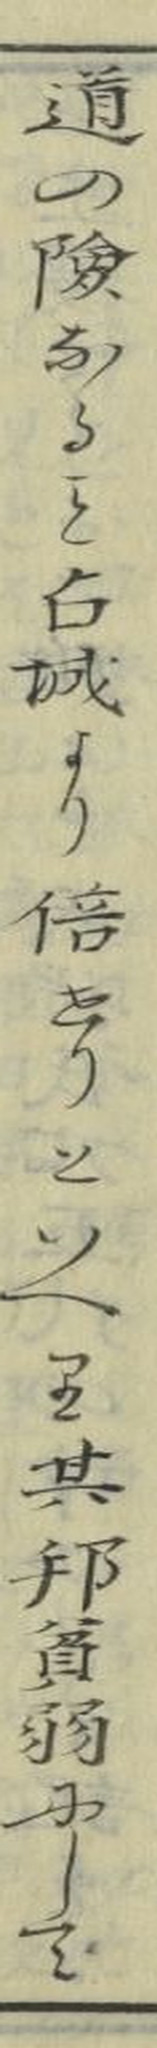道の険なること古城より倍せりといへり其邦貧弱にして
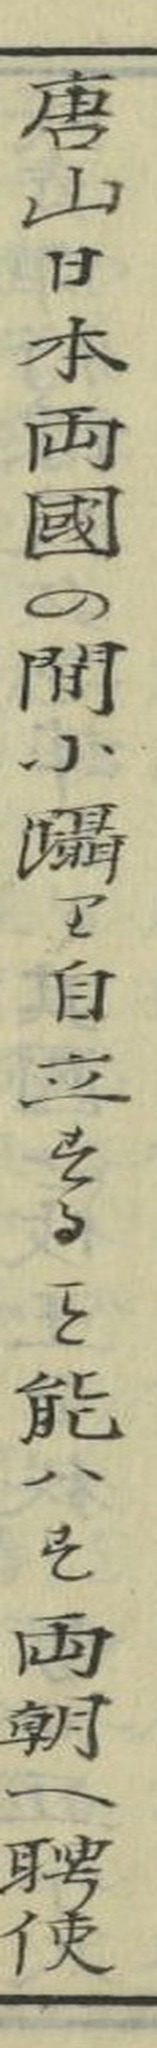唐山日本両国の間に囁り自立すること能はす両朝へ聘使
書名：琉球沿革志 下
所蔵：University of the Ryukyus Library
